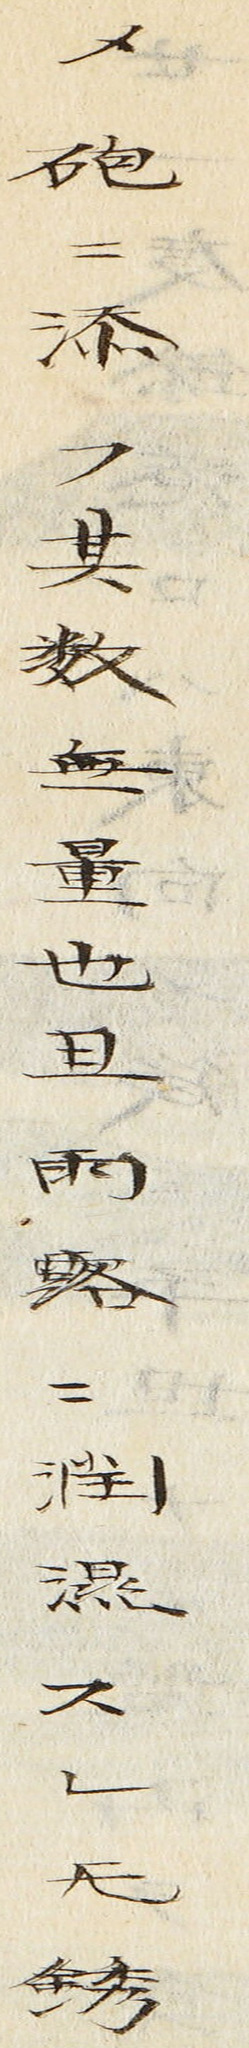シテ砲ニ添フ其数無量也且雨露ニ潤湿スレトモ銹
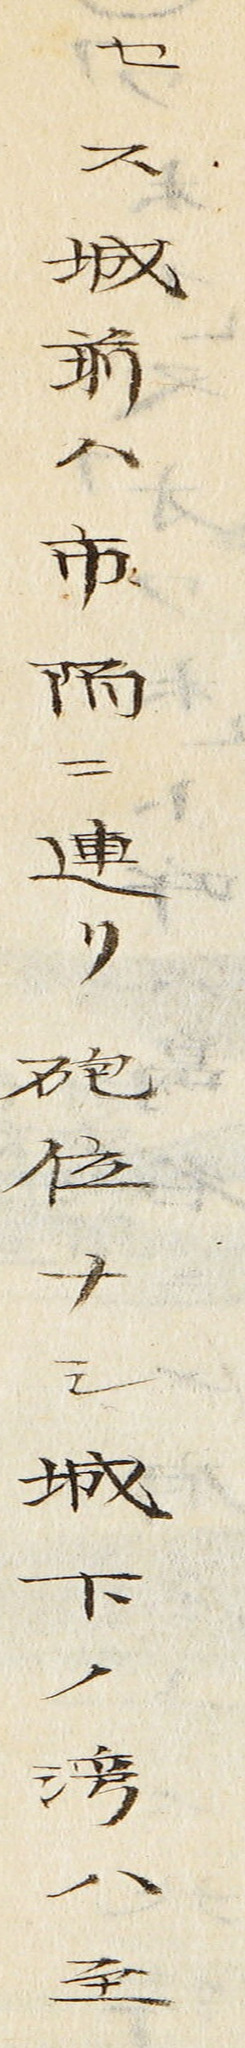セス城前ハ市陌ニ連リ砲位ナシ城下ノ湾ハ至
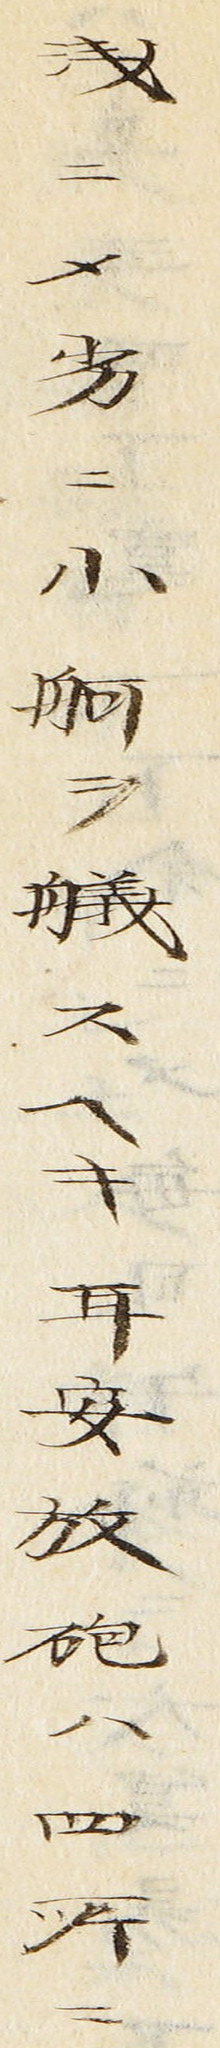浅ニシテ劣ニ小舸ヲ艤スヘキ耳安放砲ハ四所ニ
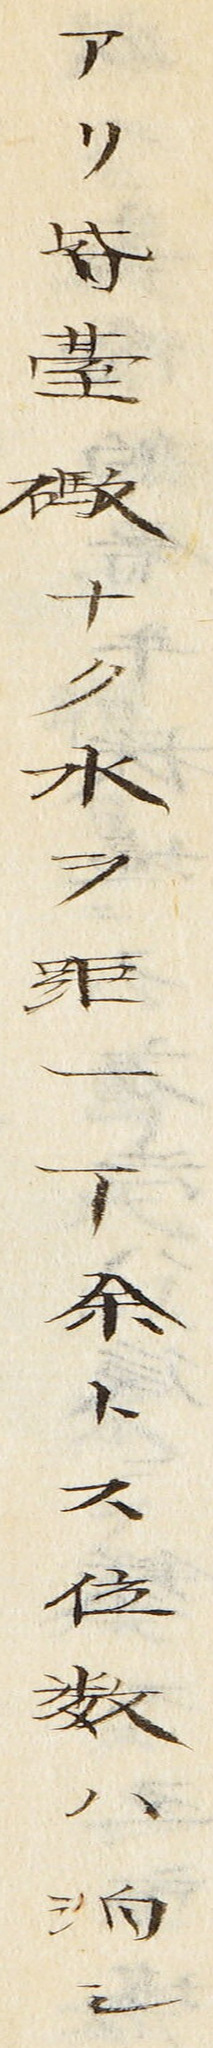アリ皆䑓礟ナク水ヲ距一丁余トス位数ハ泊シ
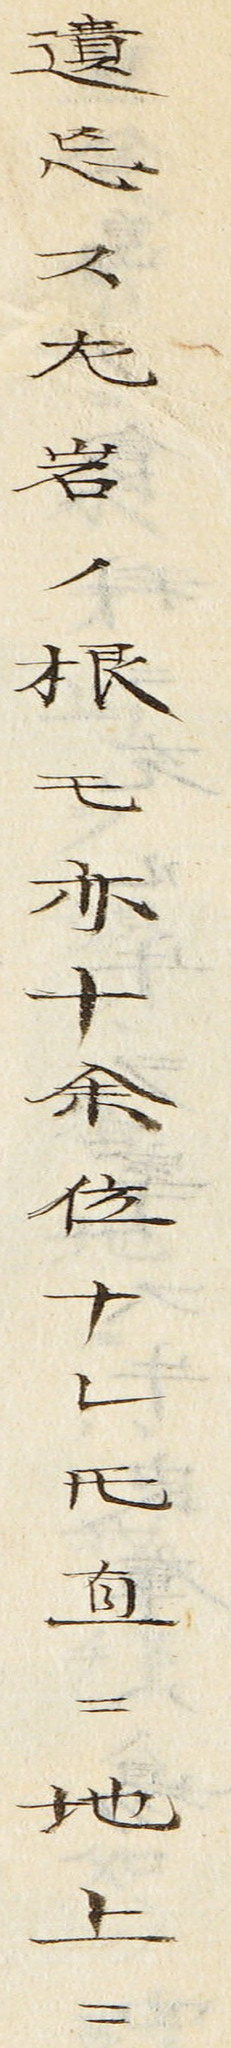カラス府南ノ沙濱ハ十余位ナレトモ直ニ地上ニ
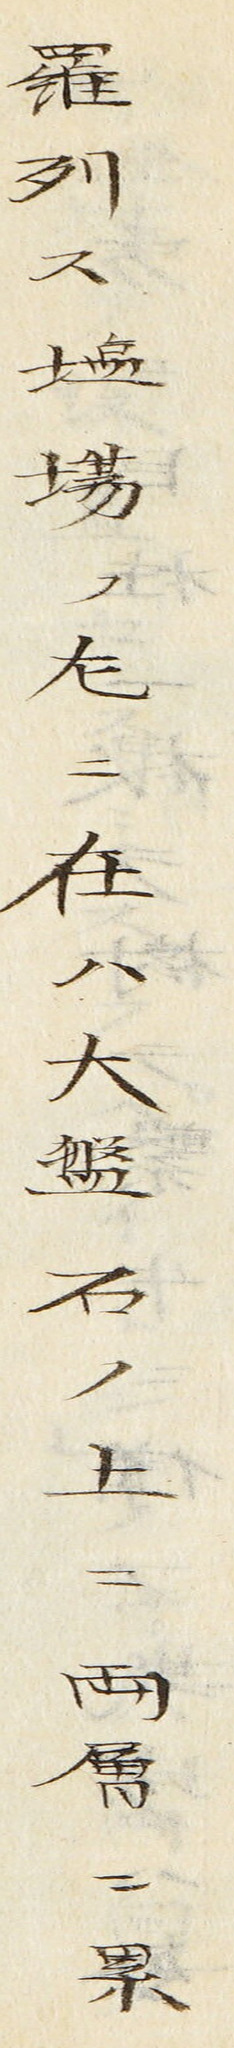羅列ス塩場ノ左ニ在ハ大磐石ノ上ニ両層ニ累
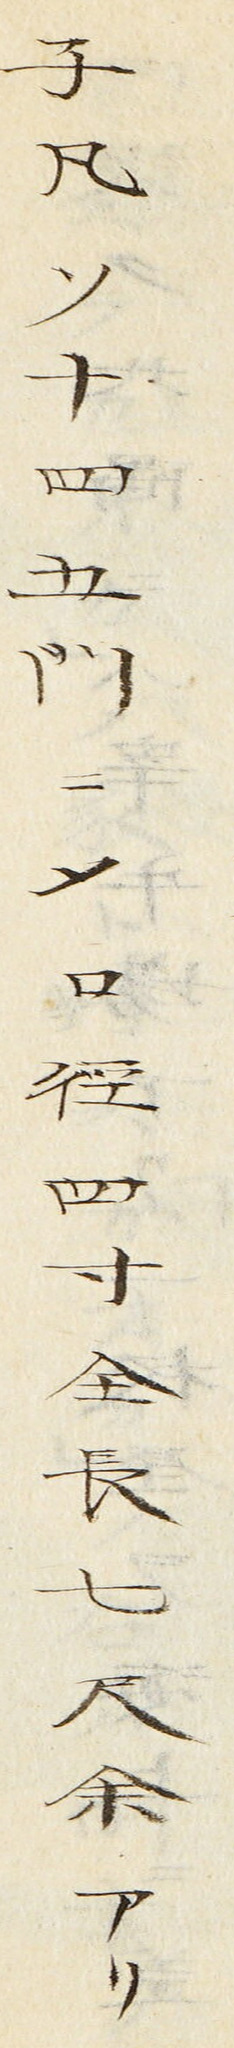ネ凡ソ十四五門ニシテ口径四寸全長七尺余アリ
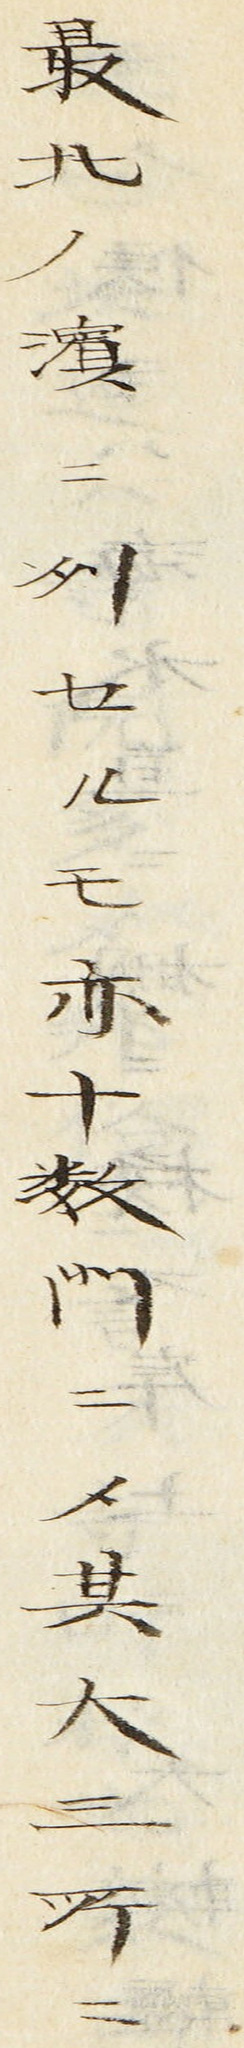最北ノ濱ニ列？セルモ亦十数門ニシテ其大三所ニ
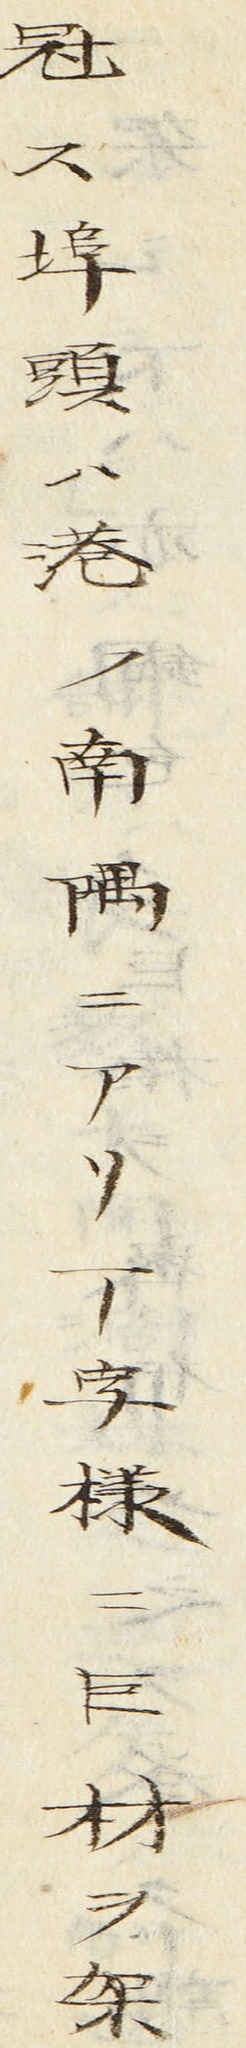冠ス埠頭ハ港ノ南隅ニアリ丁字様ニ巨材ヲ架
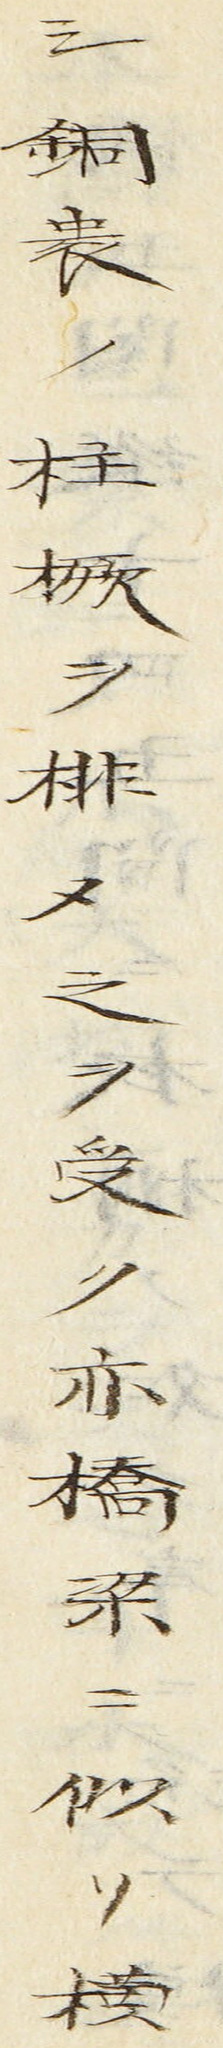シ銅ノ柱橛ヲ棑シテ之ヲ受ク亦橋梁ニ似リ横
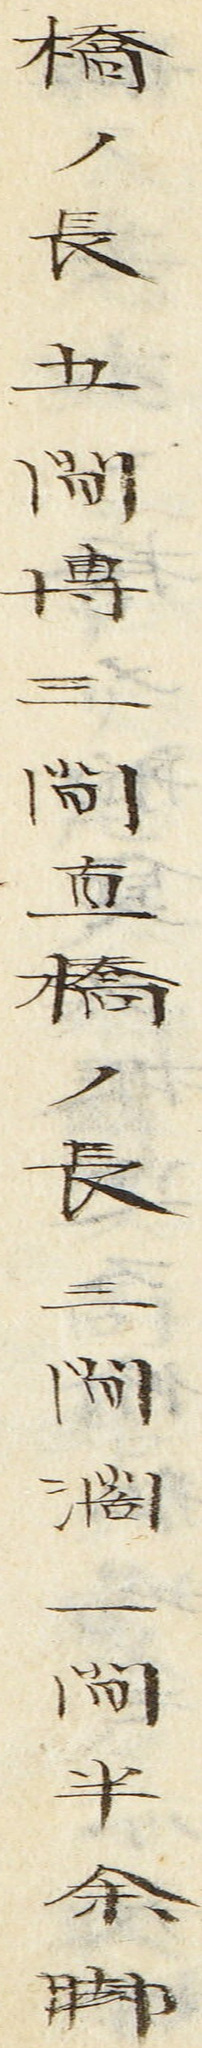橋ノ長五間博三間直橋ノ長三間濶一間半余脚

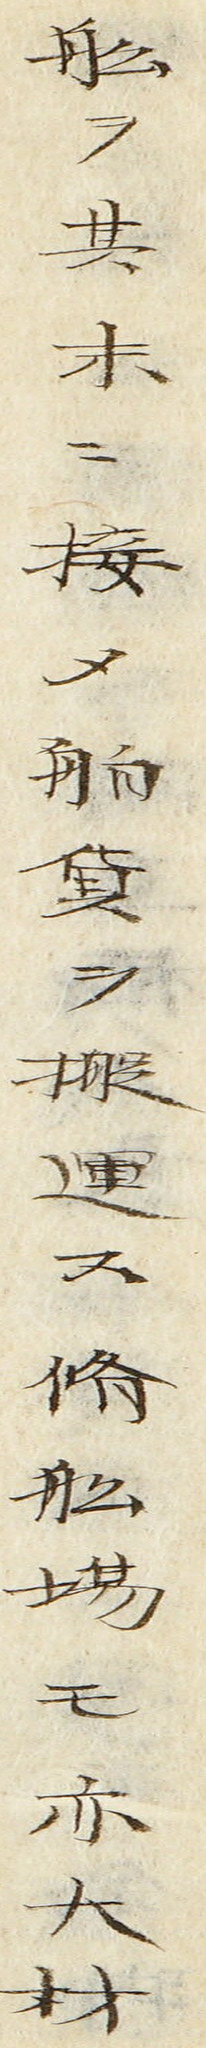舩ヲ其末ニ按シテ舩貨ヲ搬運ス脩舩場モ亦大材
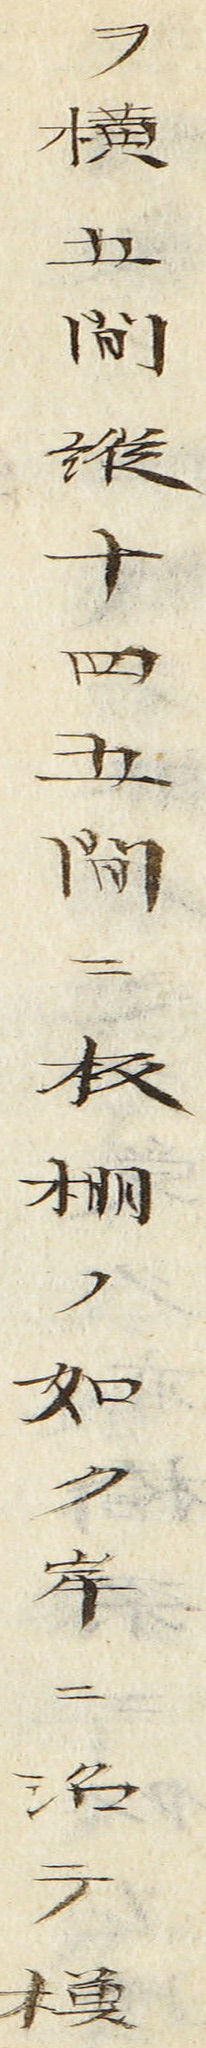ヲ横五間縦十四五間ニ板棚ノ如ク岸二沿？テ横？
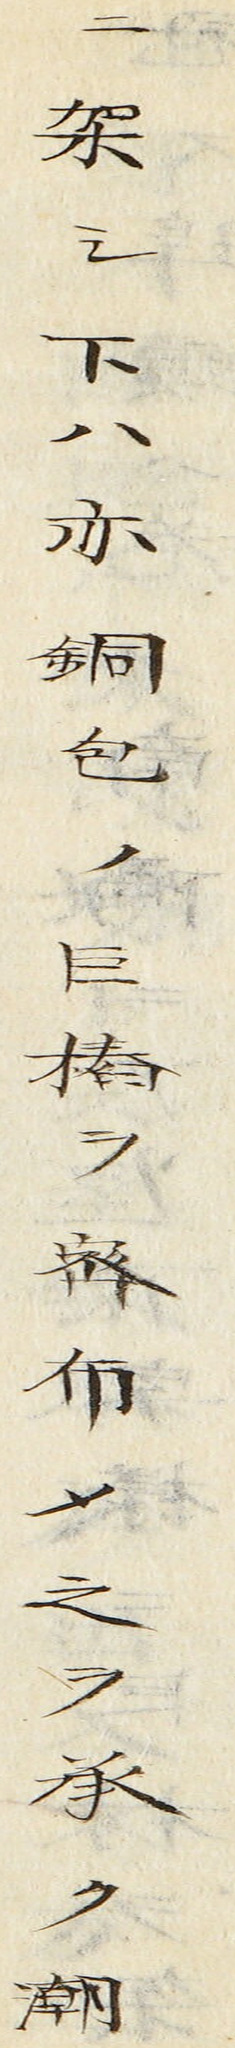ニ架シ下ハ亦銅包ノ巨樁ヲ密布シテ之ヲ承ク潮
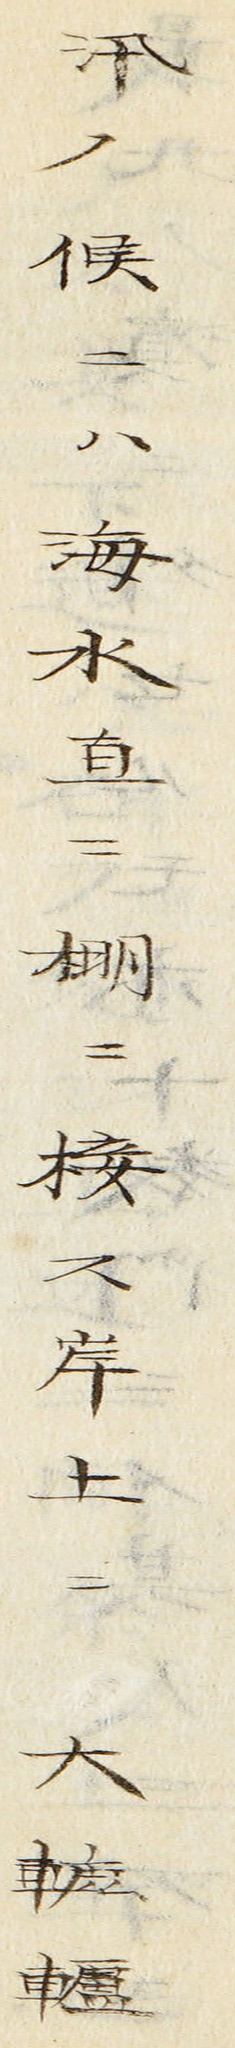汛ノ候ニハ海水直ニ棚ニ接ス岸上ニ大轆轤
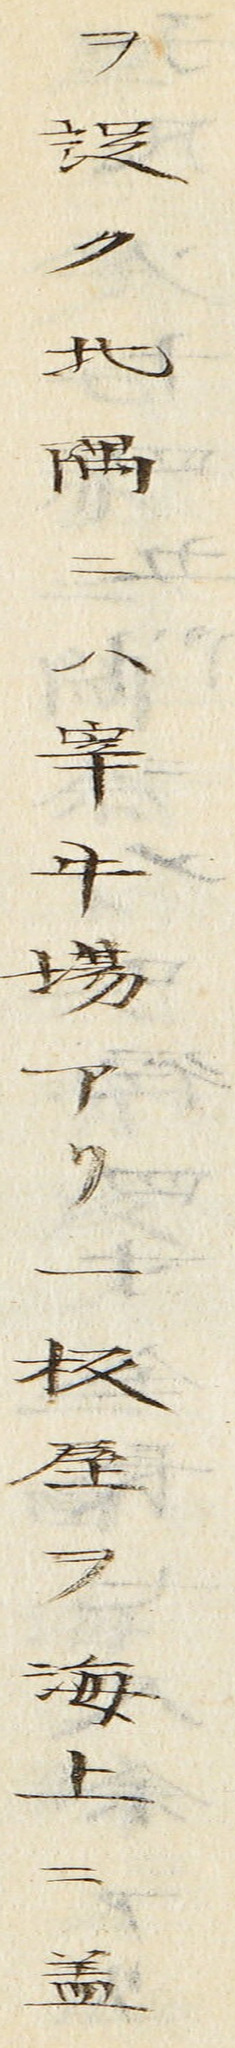ヲ設ク北隅ニハ宰井場アリ一板屋ヲ海上ニ盖
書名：蕃談
